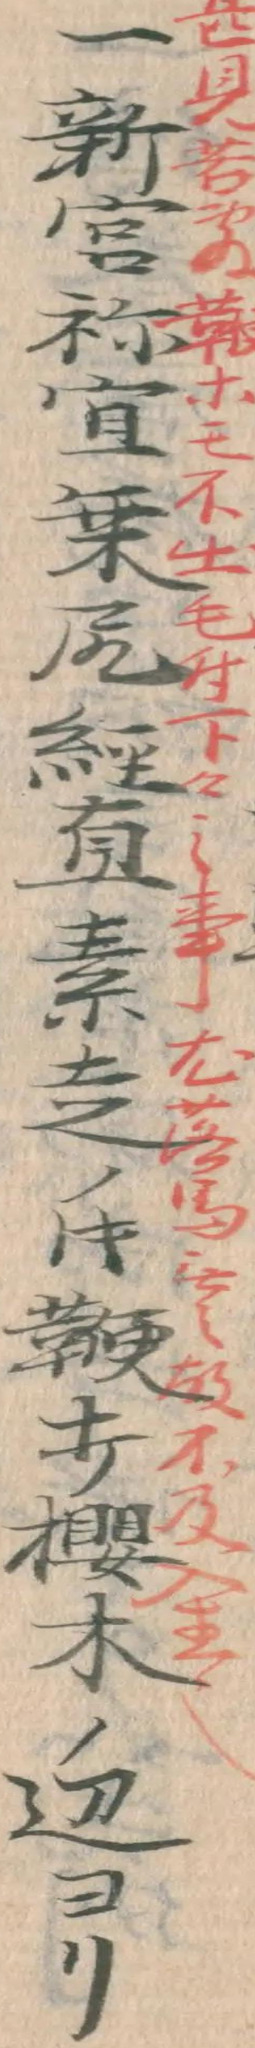一新宮祢宜乗尻経直素走ノトキ鞭打桜木ノ辺ヨリ
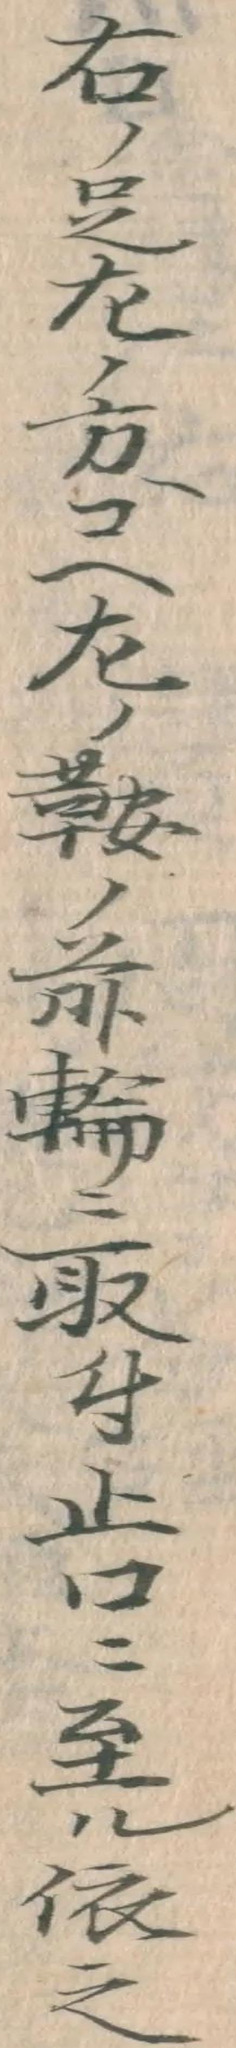右ノ足左ノ方ヘコヘ左ノ鞍ノ前輪ニ取付止口ニ至ル依之
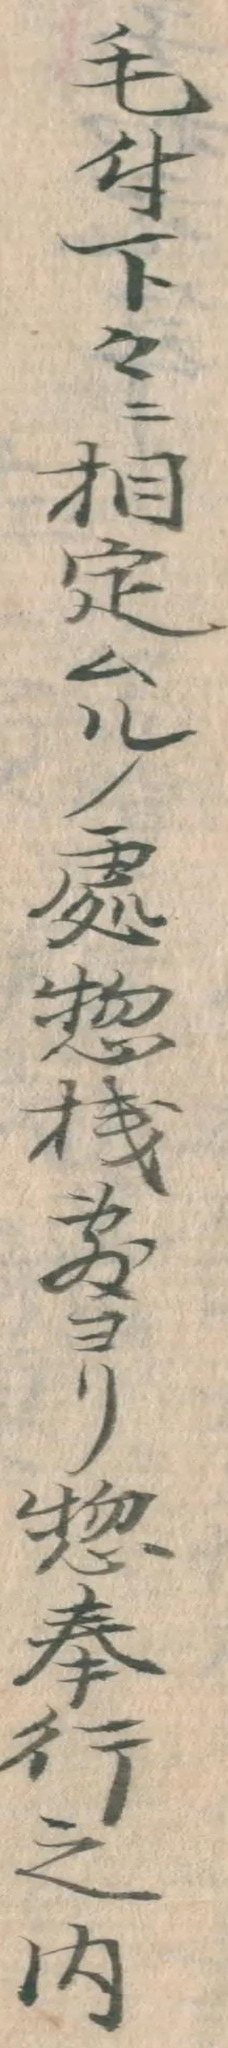毛付下々ニ相定ムルノ処惣桟敷ヨリ惣奉行之内
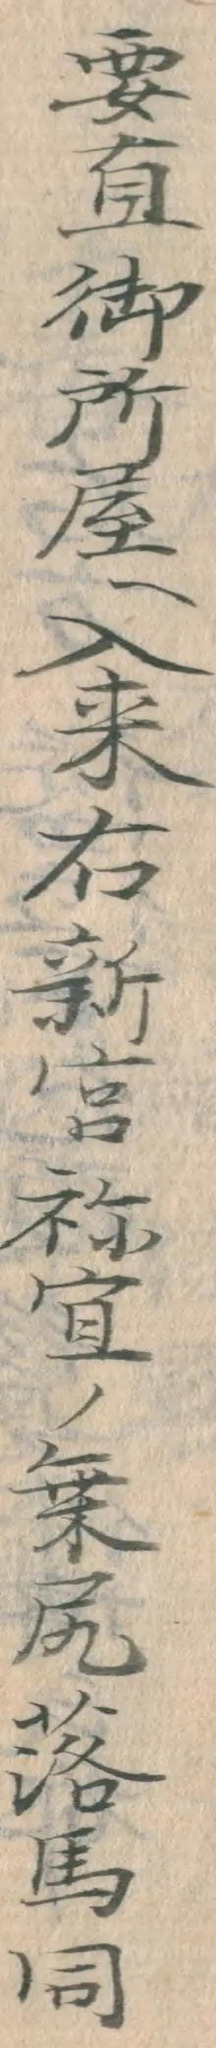要直御所屋ヘ入来右新宮祢宜ノ乗尻落馬同
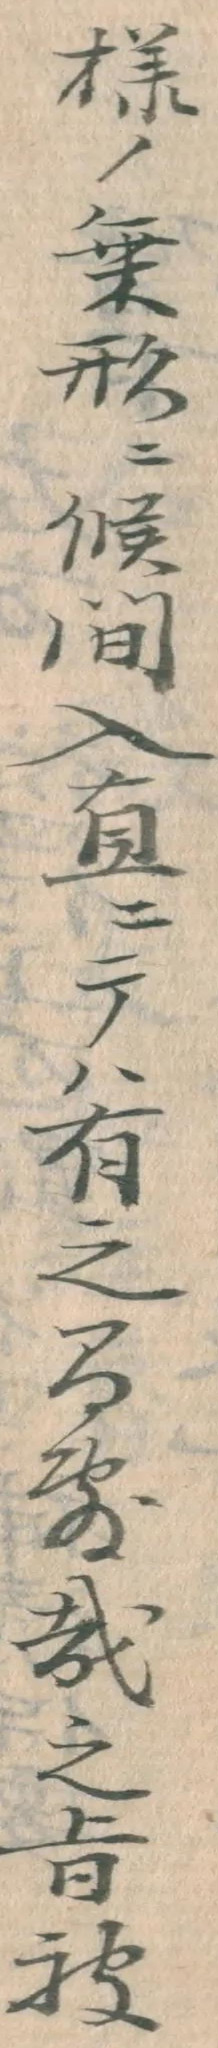様ノ乗形ニ候間入直ニテハ有之間敷哉之旨被
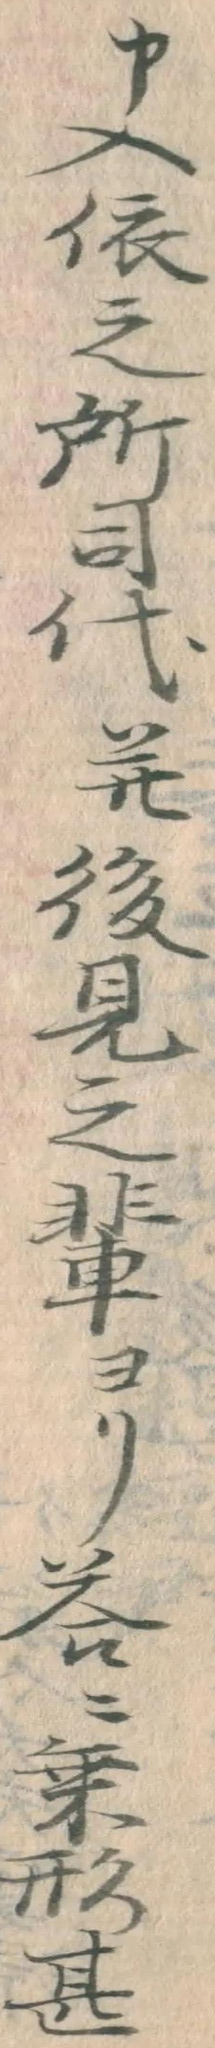申入依之所司代并後見之輩ヨリ答ニ乗形甚
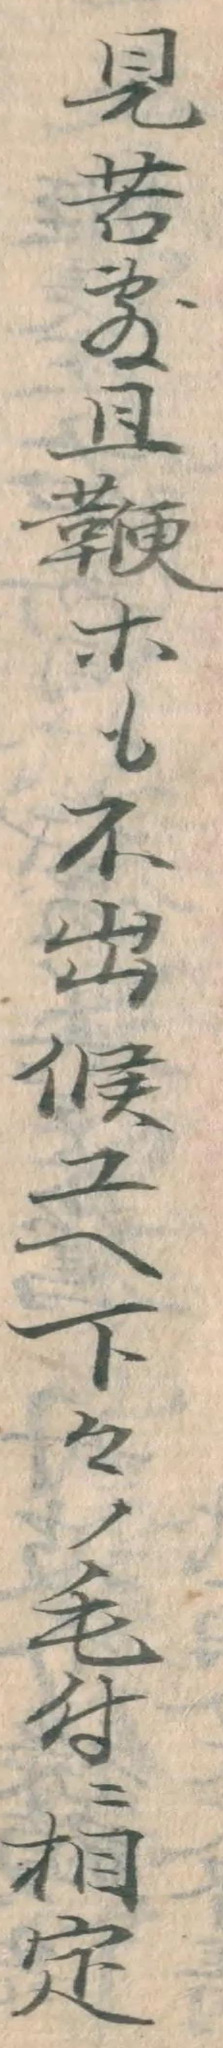見苦敷且鞭等も不出候ユヘ下々ノ毛付ニ相定
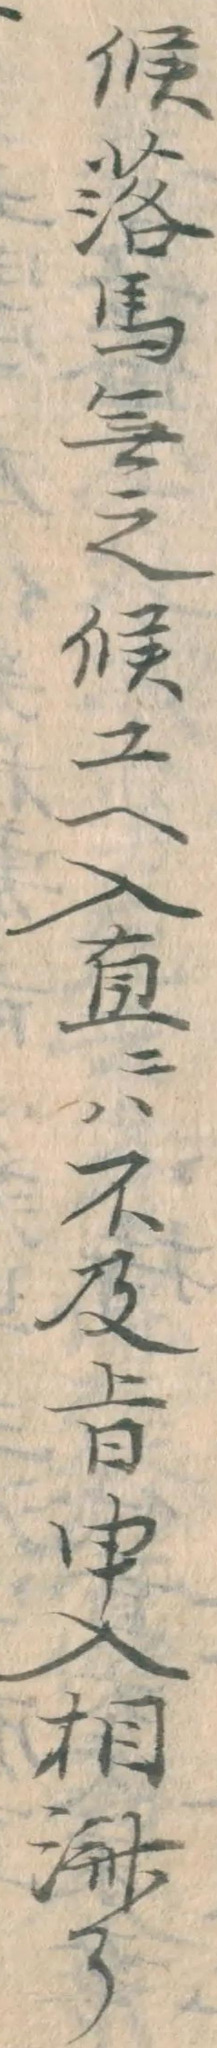候落馬無之候ユヘ入直ニハ不及旨申入相済了

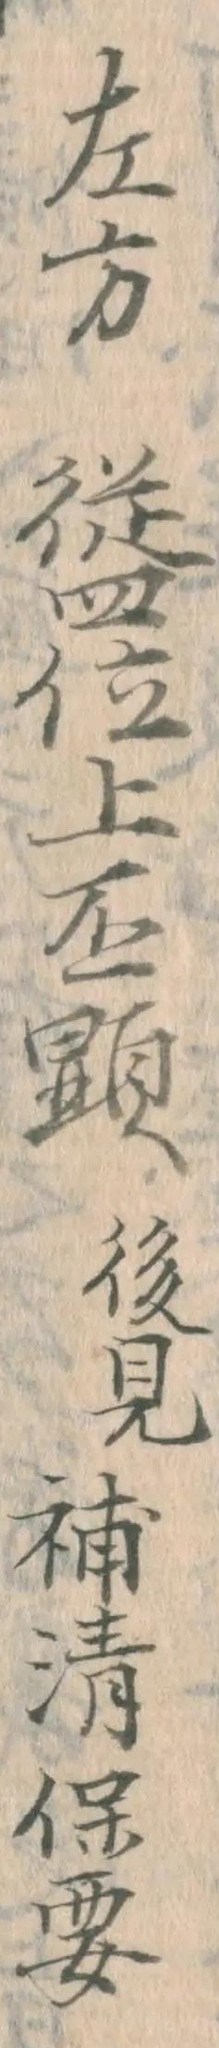左方従四位上丕顕後見補清保要
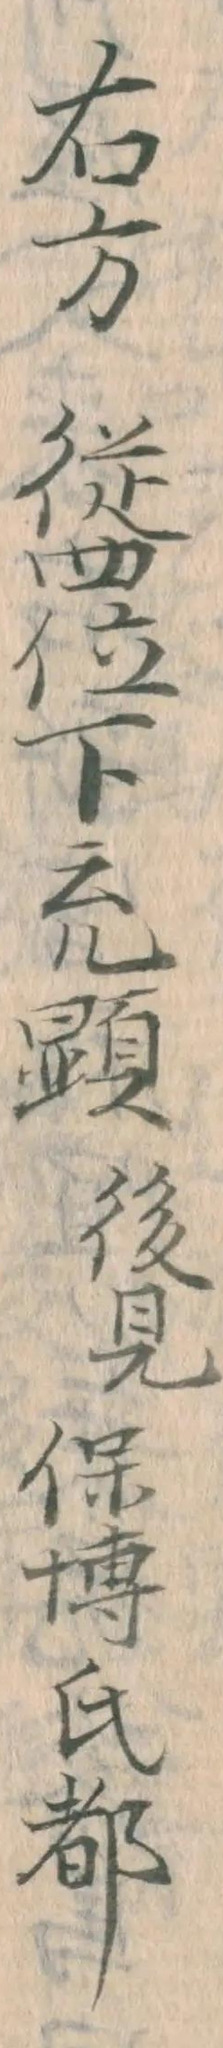右方従四位下充顕後見保博氏都
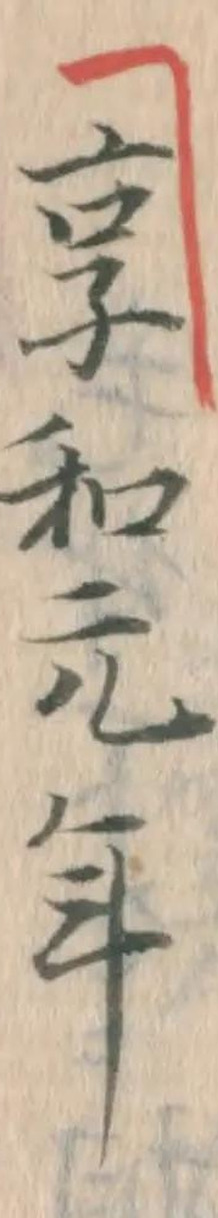享和元年
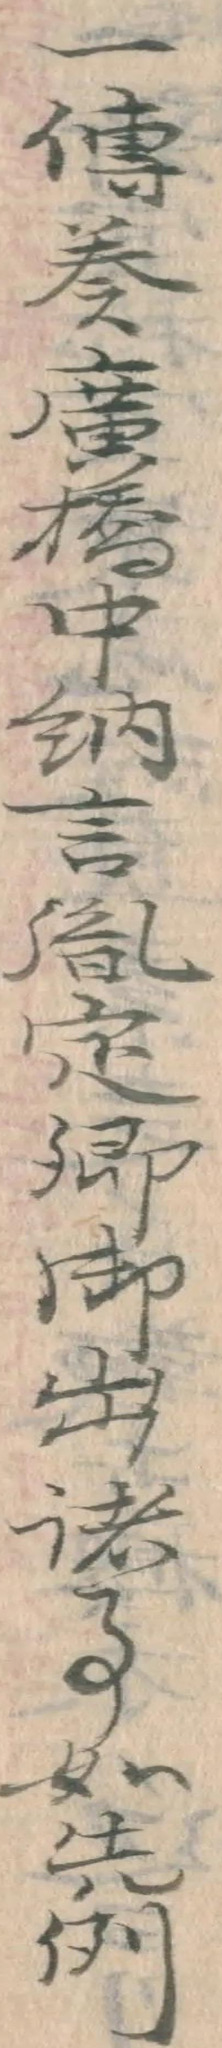一伝奏広橋中納言胤定卿御出諸事如先例
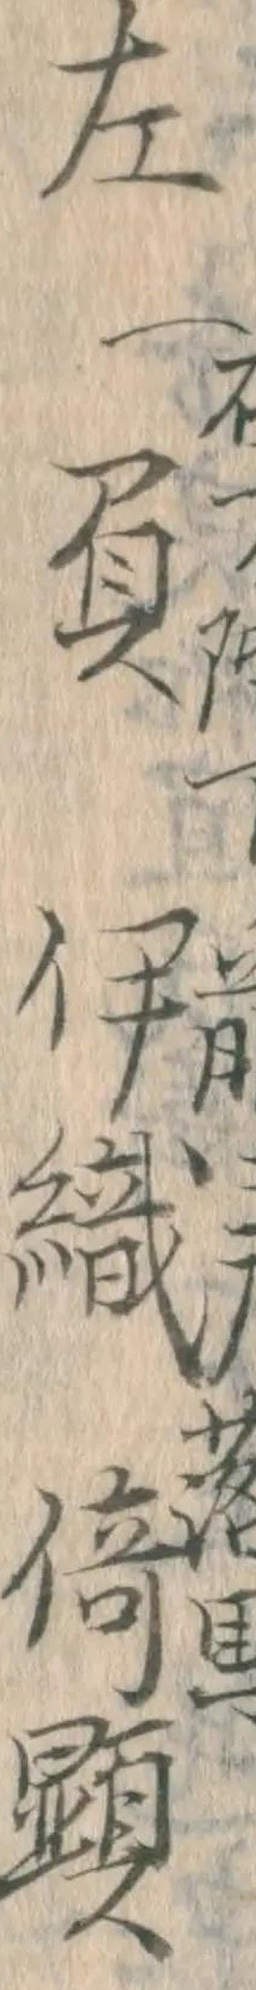左負伊織倚顕
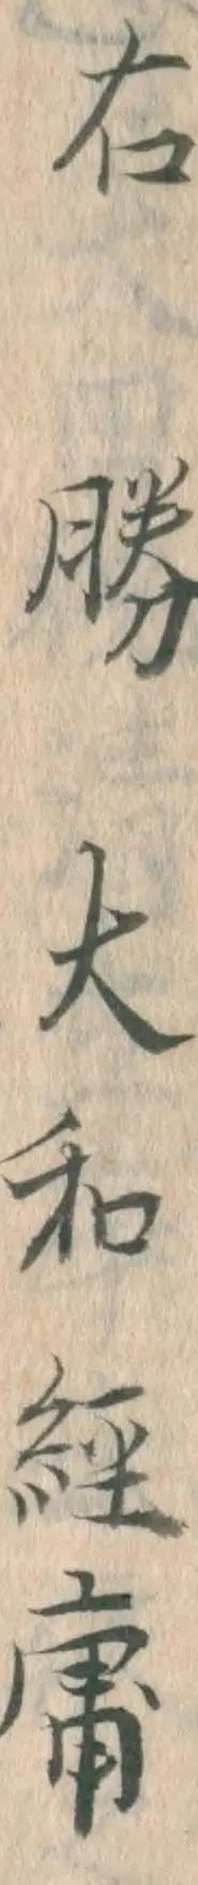右勝大和経庸
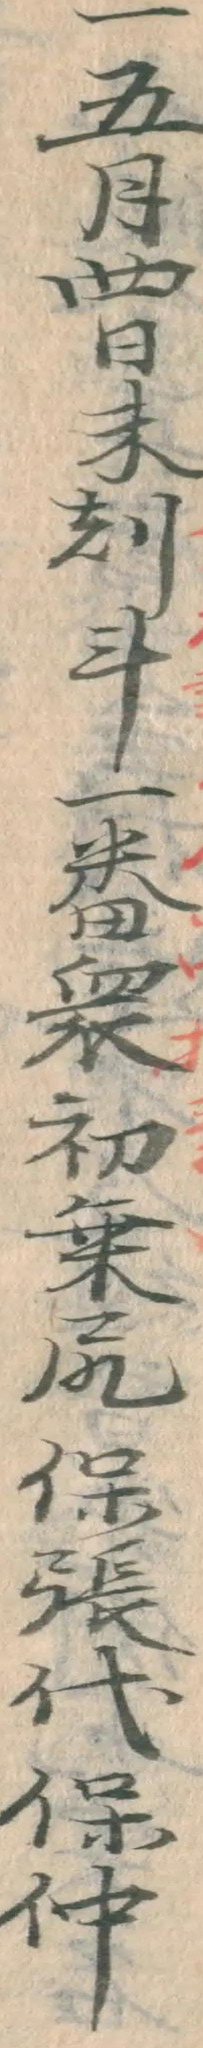一五月四日未刻計一番衆初乗尻保張代保仲
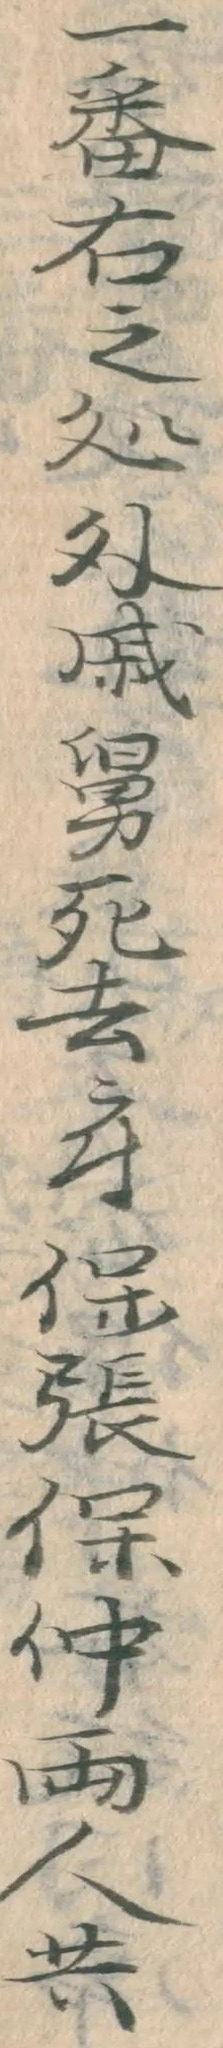一番右之処外戚舅死去ニ付保張保仲両人共
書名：賀茂社記録. 第10冊
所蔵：国立国会図書館 National Diet Library, JAPAN
